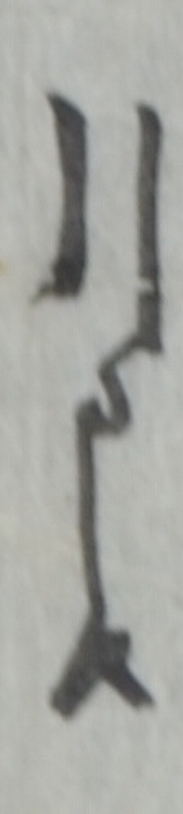引申候

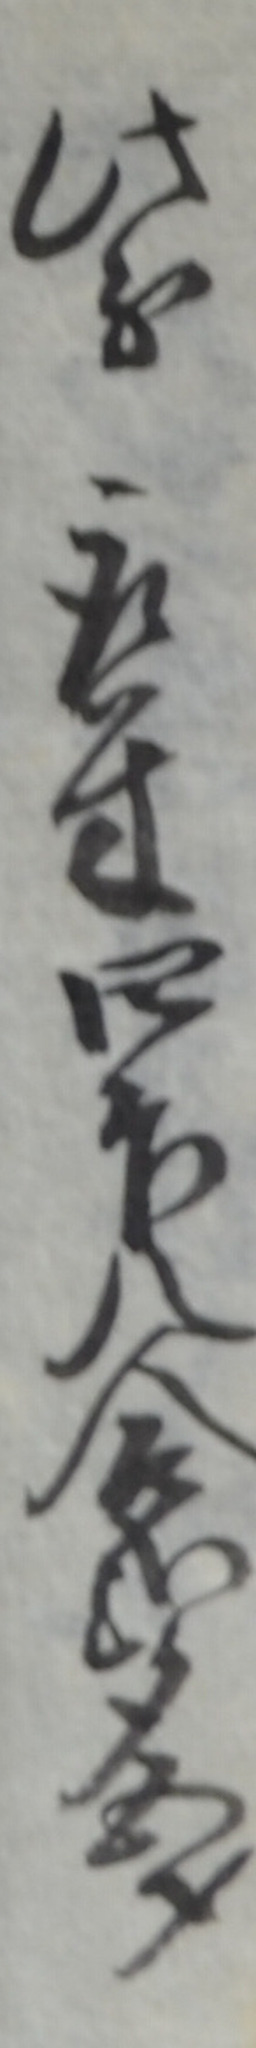此分取米四升八合弐勺五才
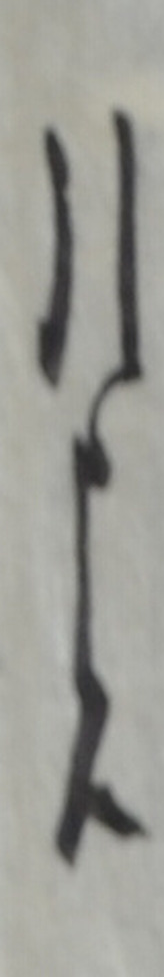引申候
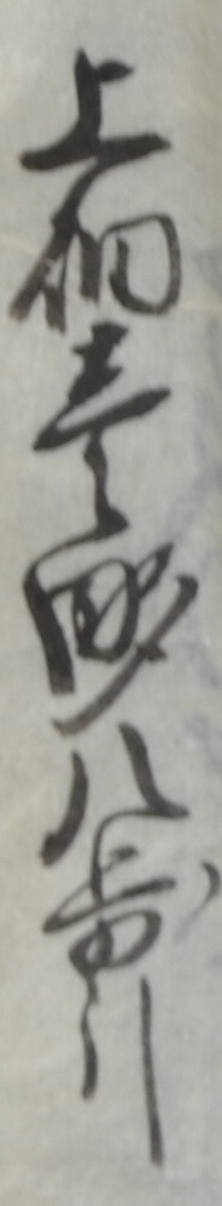上畑壱畝八歩引
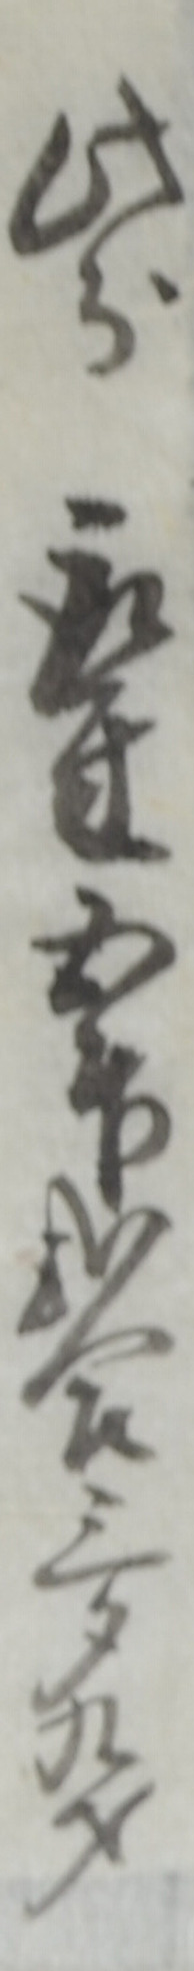此分取米五升弐合三勺
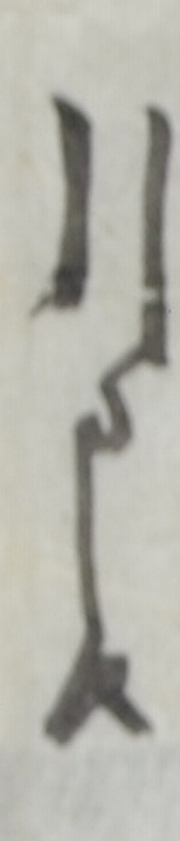引申候
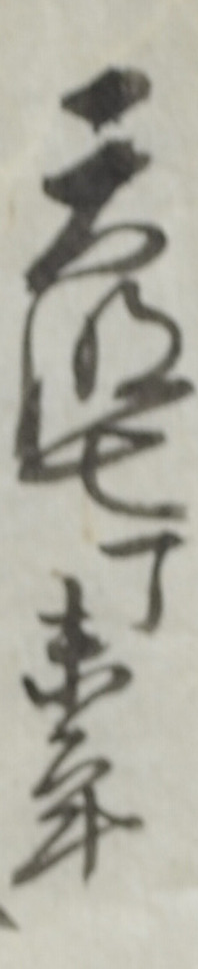天明七丁未年
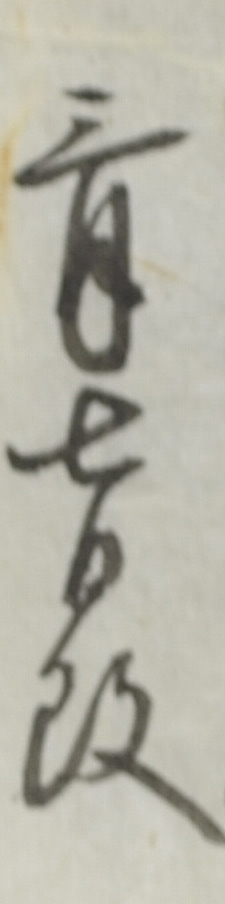三月七日改

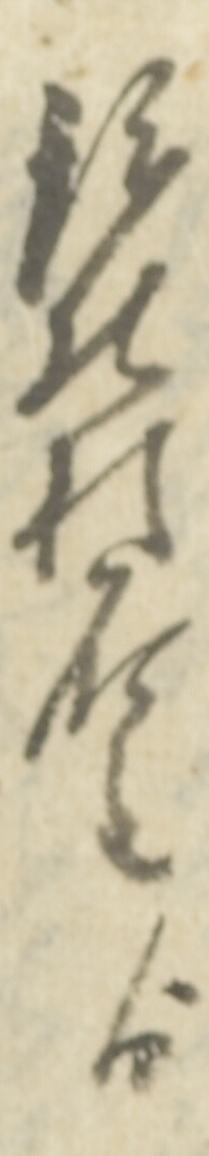鉾次村名主ゟ
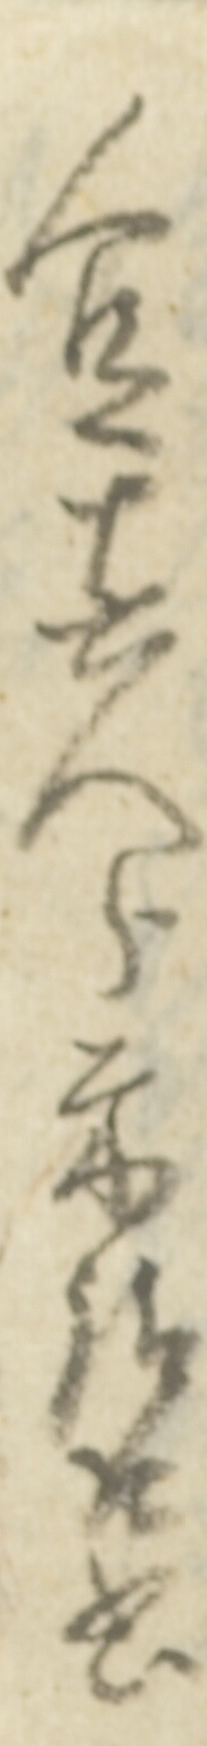人足十六人分米請取書

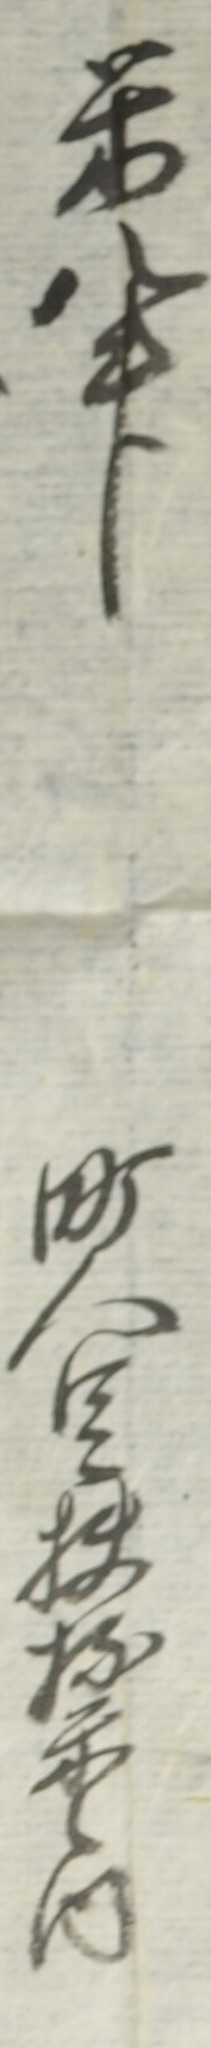米八升町人足扶持米之内
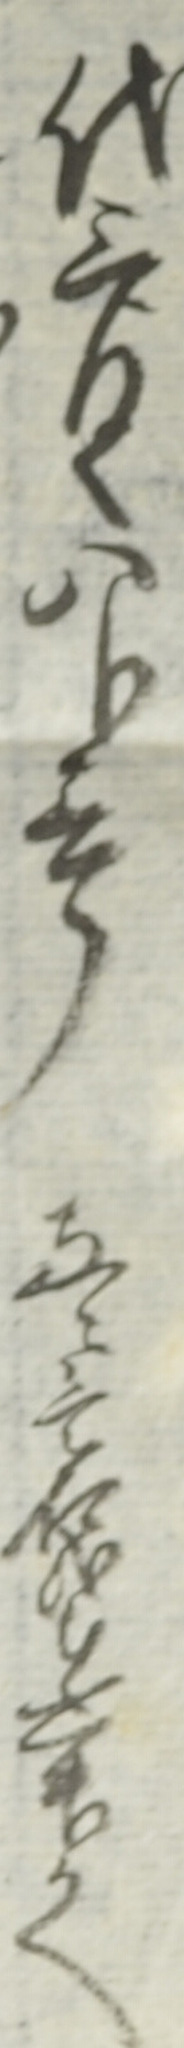代三匁八分壱り両ニ壱石弐斗六升かへ
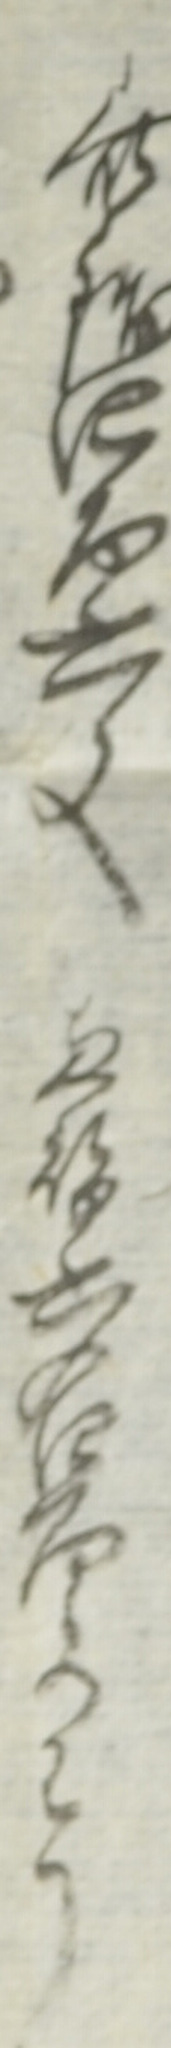此銭四百六文両替六〆四百文わり
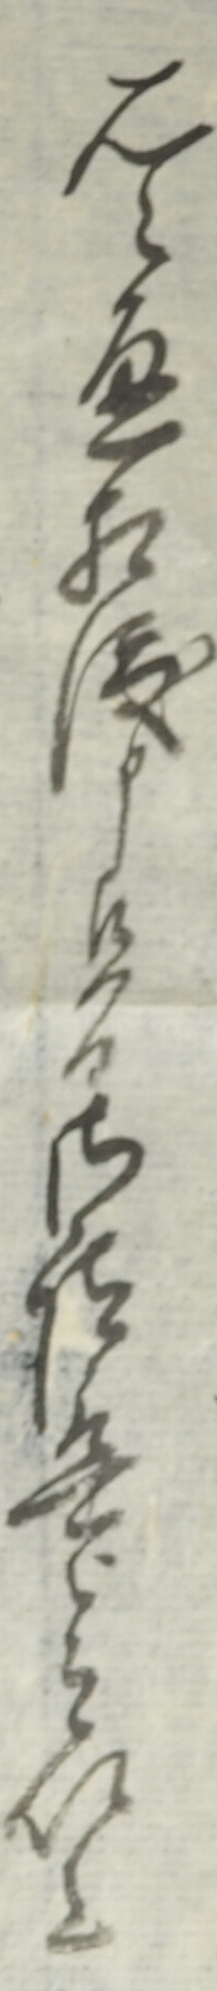右之通相渡申候間御請取可被下候以上
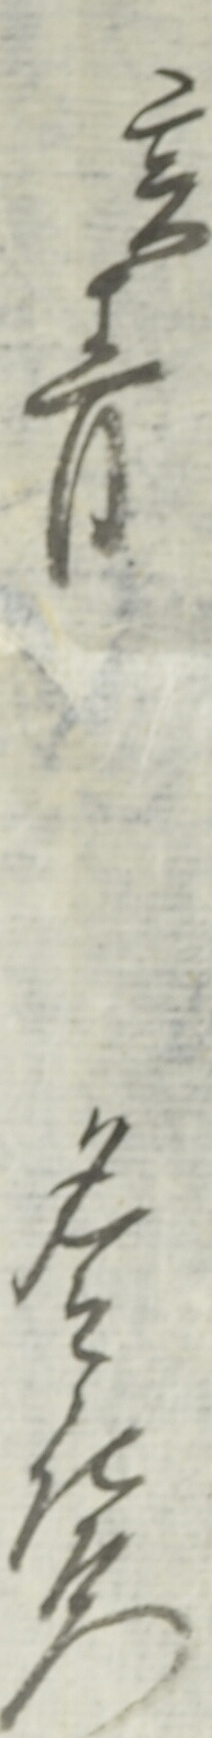亥十二月名主庄右衛門
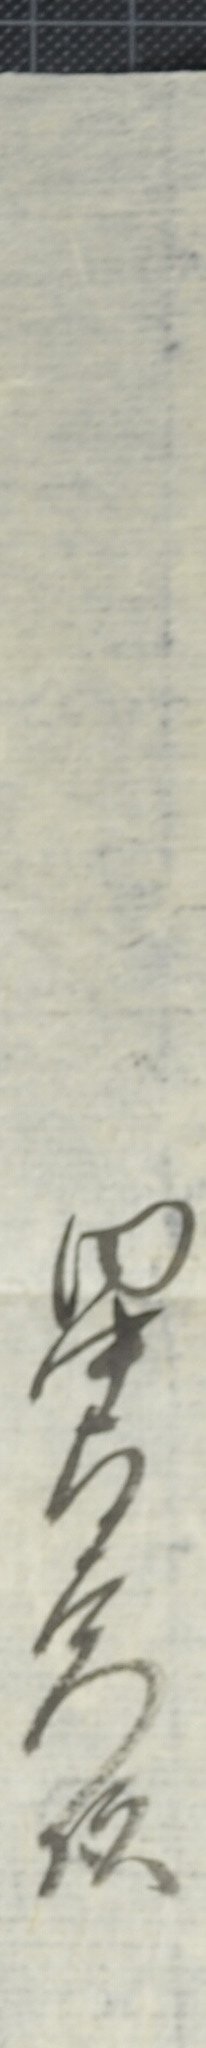田中与右衛門様
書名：鉾持村皆済権現道附替畝歩書付
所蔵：伊那市立高遠町図書館・合同会社AMANE
